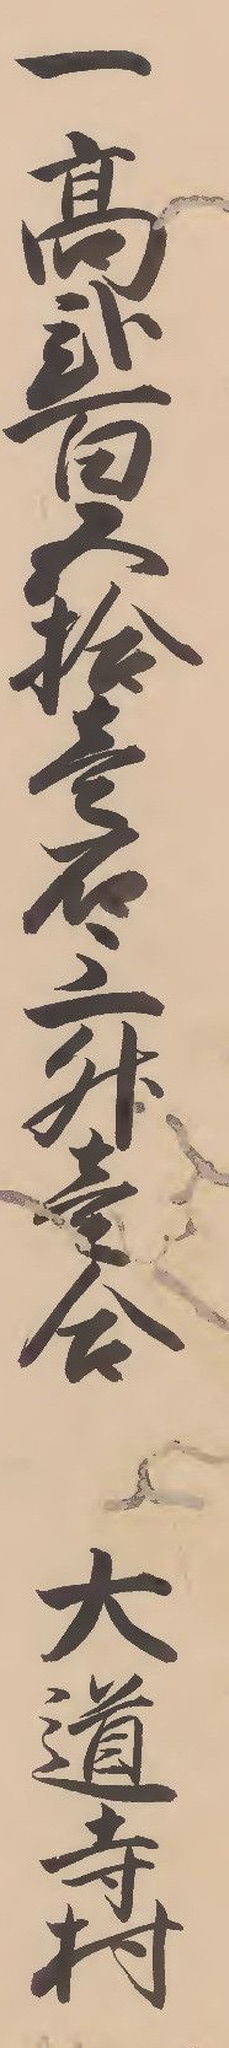一高弐百五拾壱石三升壱合大道寺村
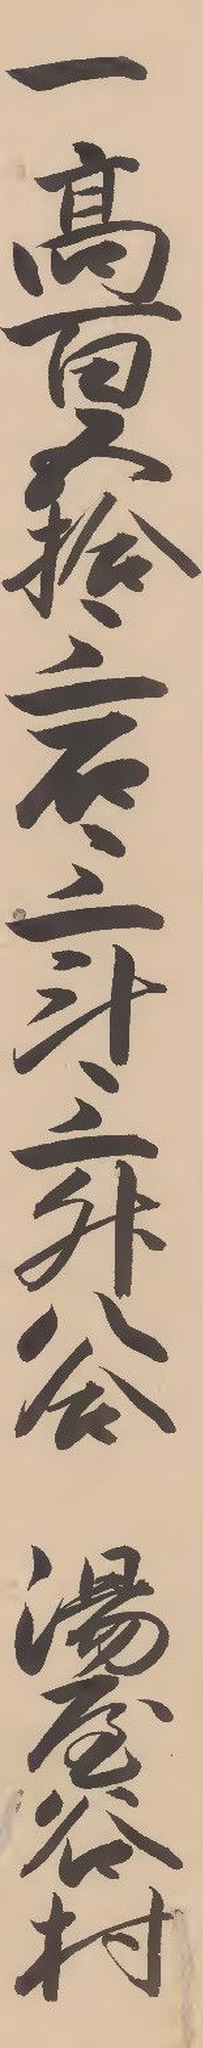一高百五拾三石三斗三升八合湯屋谷村
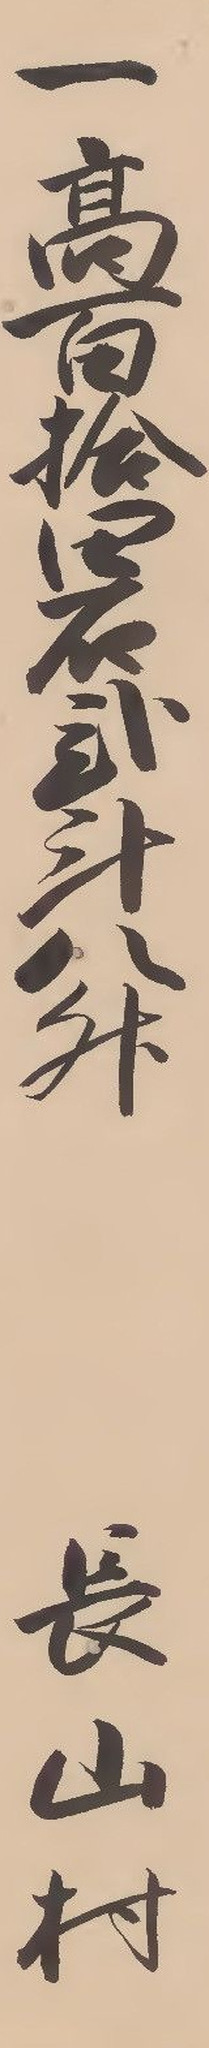一高百拾四石弐斗八升長山村
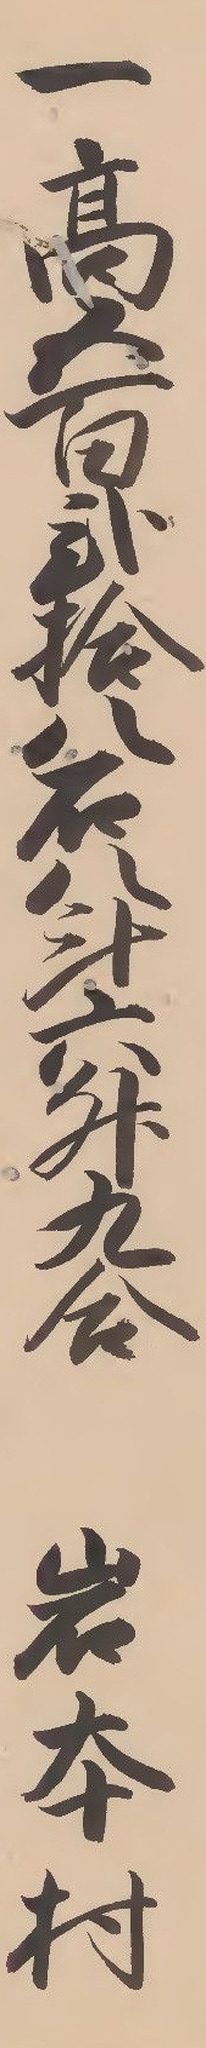一高五百弐拾八石八斗六升九合岩本村
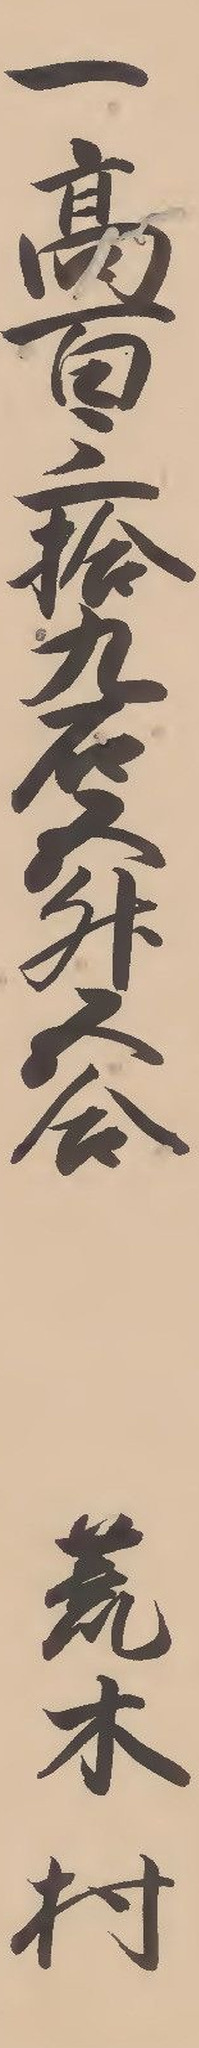一高百三拾九石五升五合荒木村
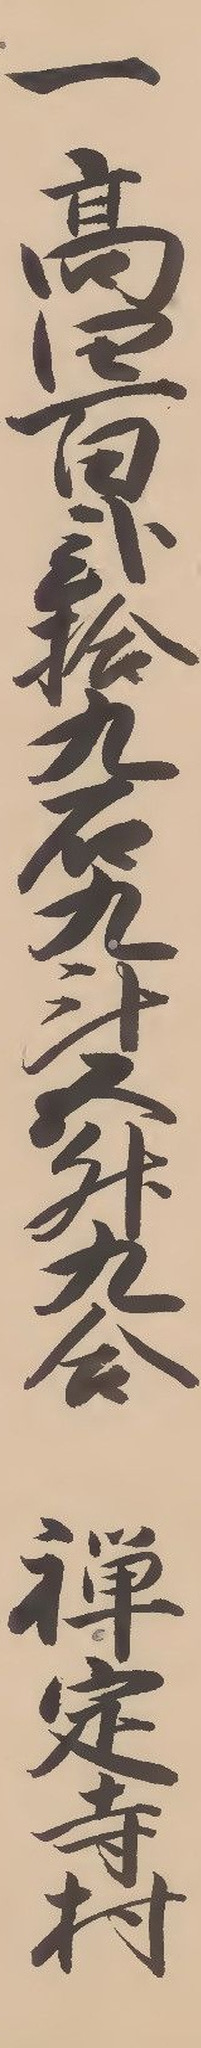一高四百弐拾九石九斗五升九合禅定寺村
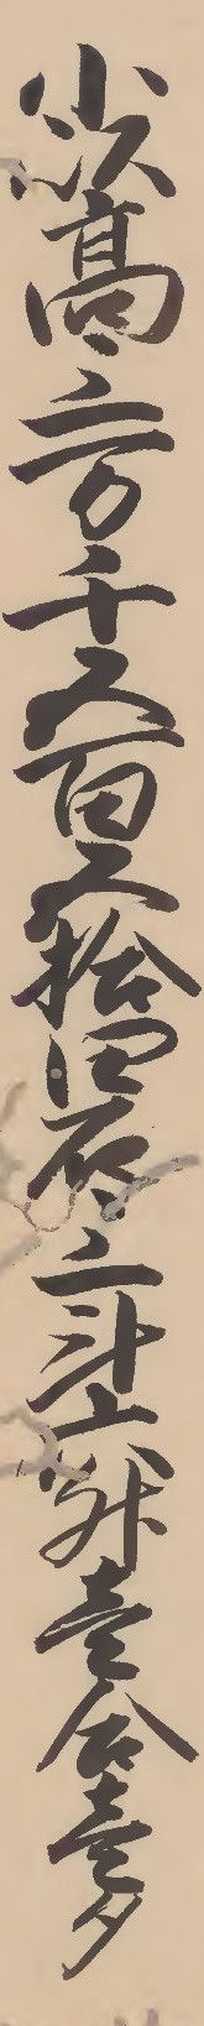小以高三万千五百五拾四石三斗六升壱合壱勺

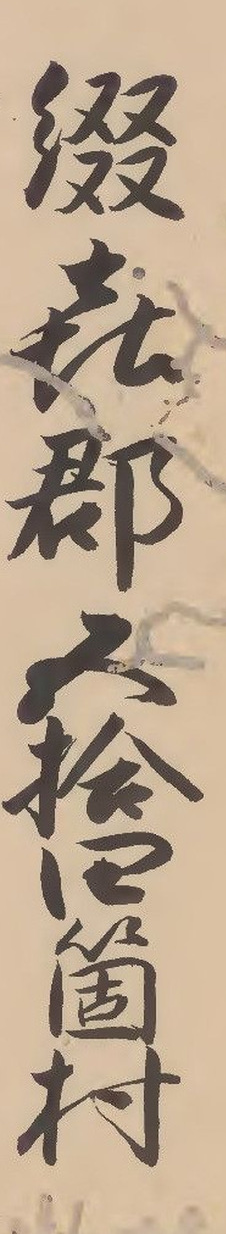綴喜郡五拾四箇村
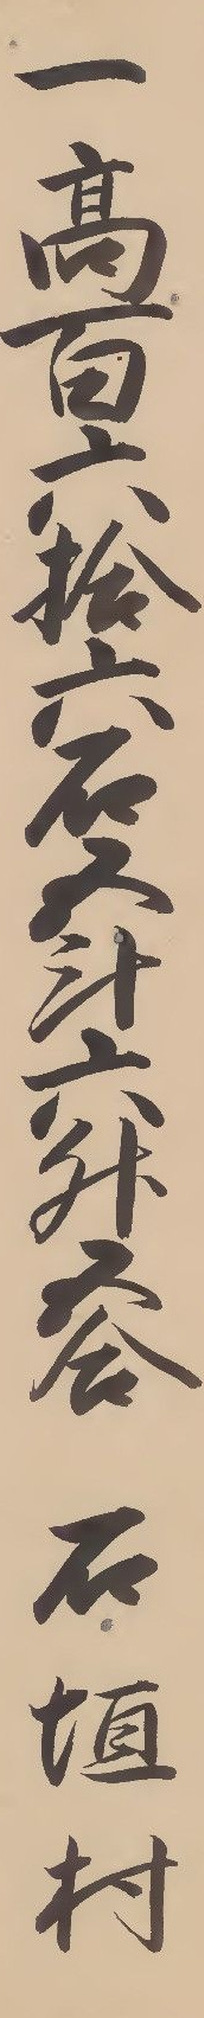一高百六拾六石五斗六升五合石垣村
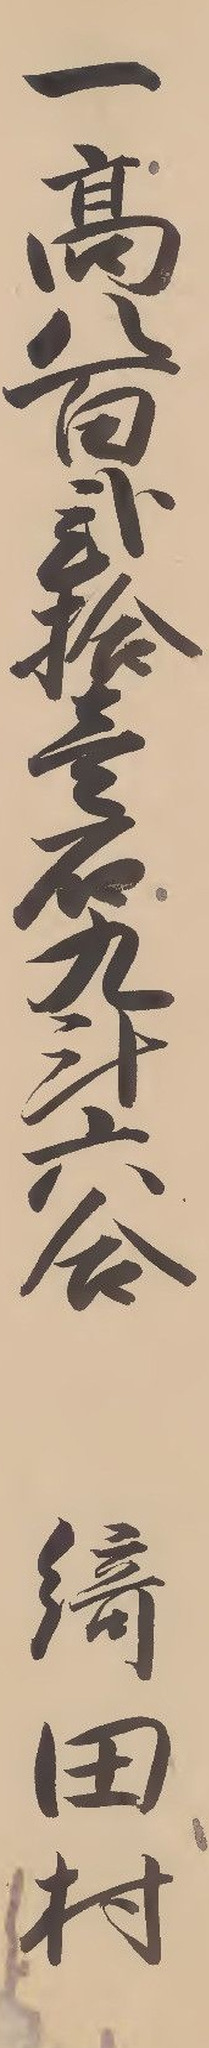一高八百弐拾壱石九斗六合綺田村
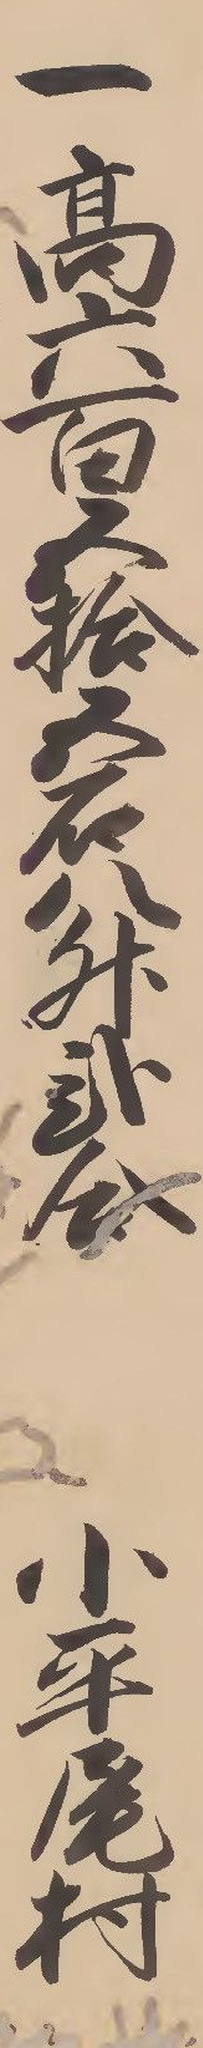一高六百五拾五石八升弐合小平尾村

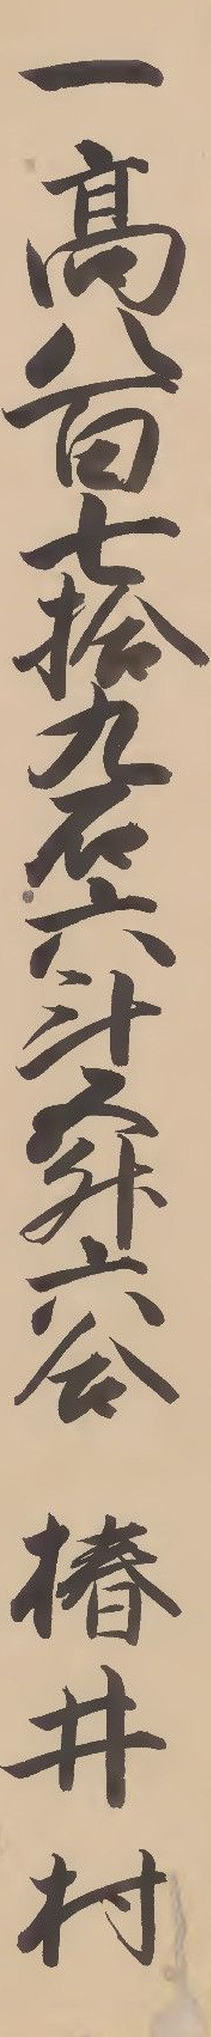一高八百七拾九石六斗五升六合椿井村
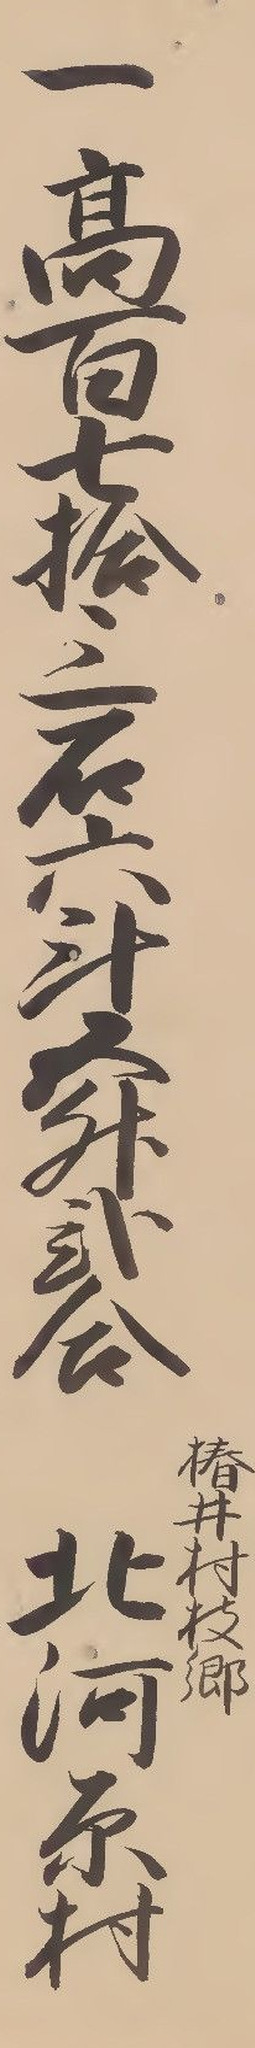一高八百七拾九石六斗五升六合椿井村
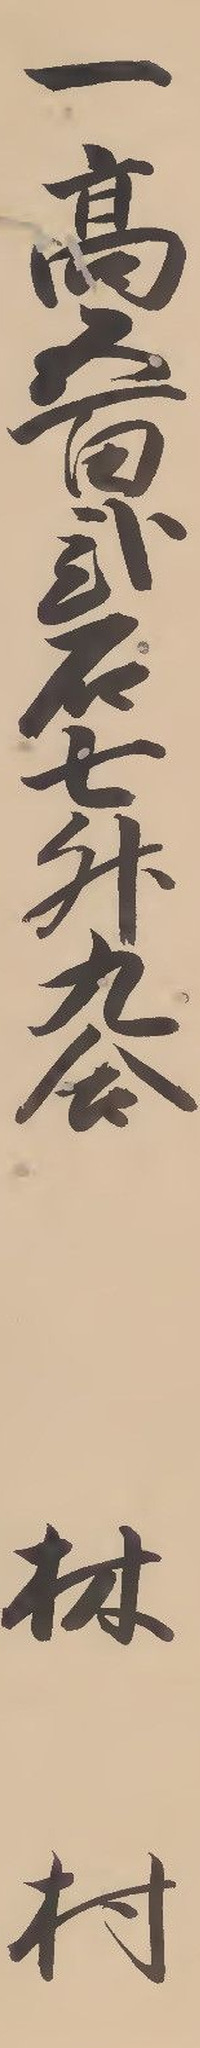一高五百弐石七升九合林村
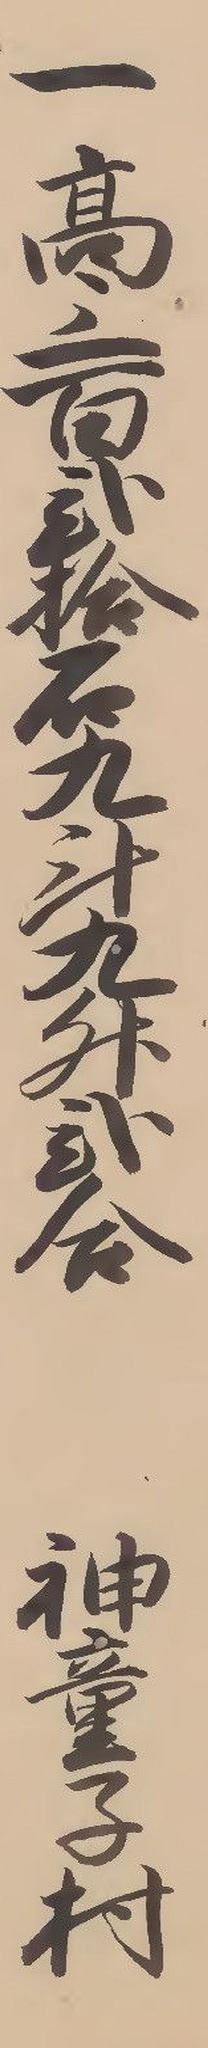一高三百弐拾石九斗九升弐合神童子村
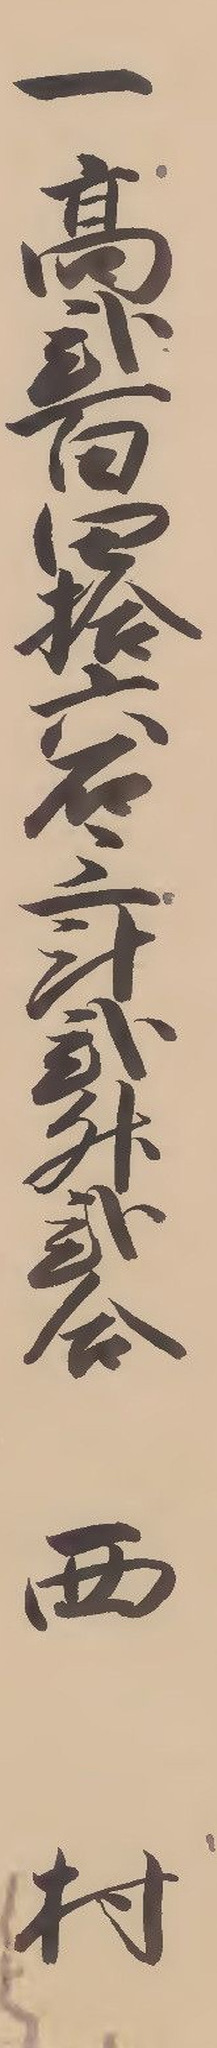一高弐百四拾六石三斗弐升弐合西村
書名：山城国郷帳
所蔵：国立公文書館 National Archives of Japan
